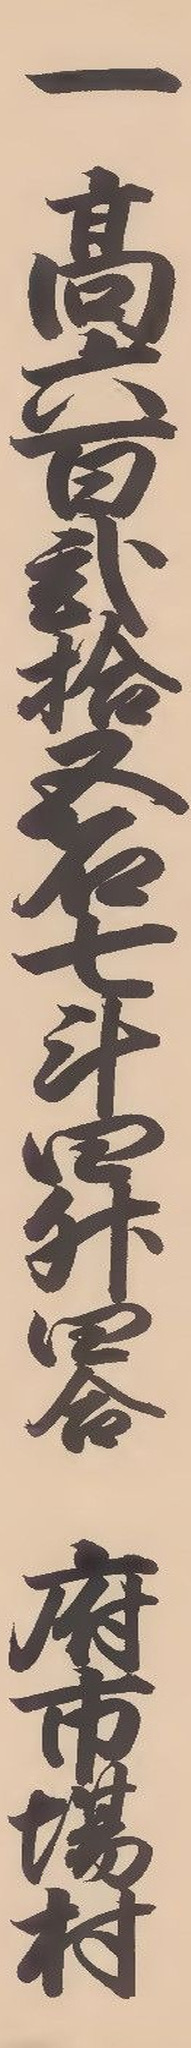一高六百弐拾五石七斗四升四合府市場村
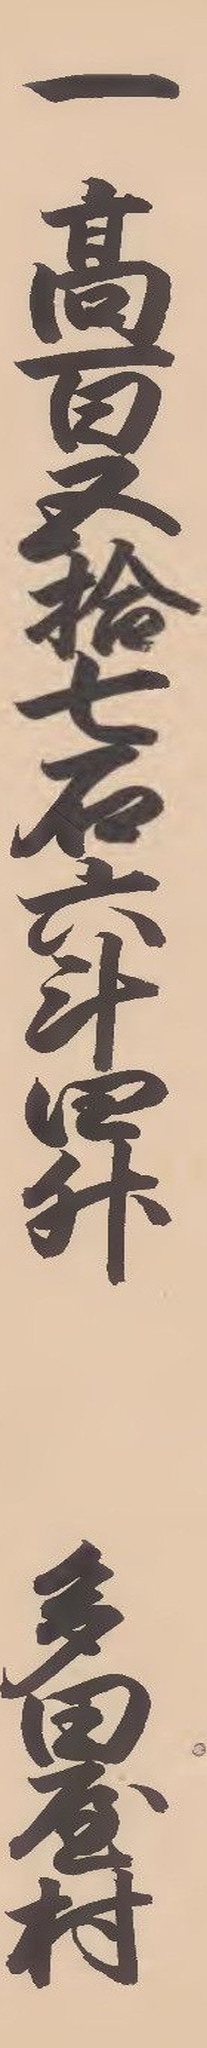一高百五拾七石六斗四升多田屋村
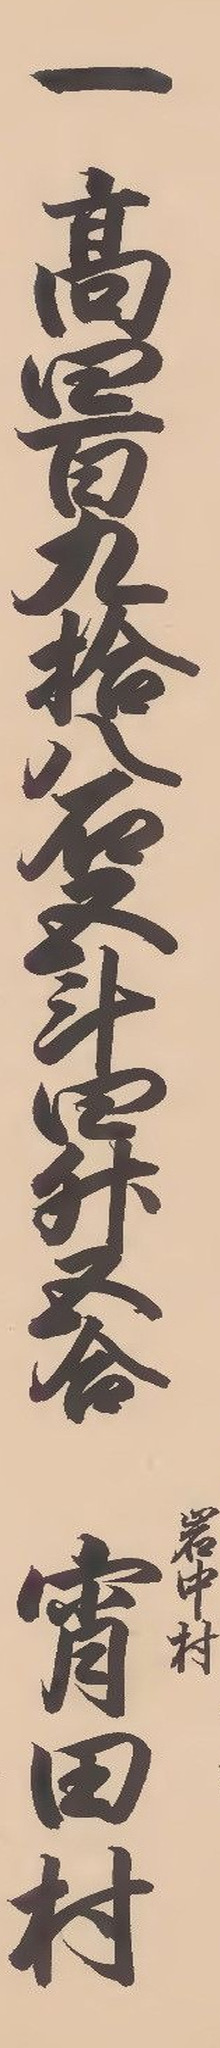一高四百九拾八石五斗四升五合宵田村
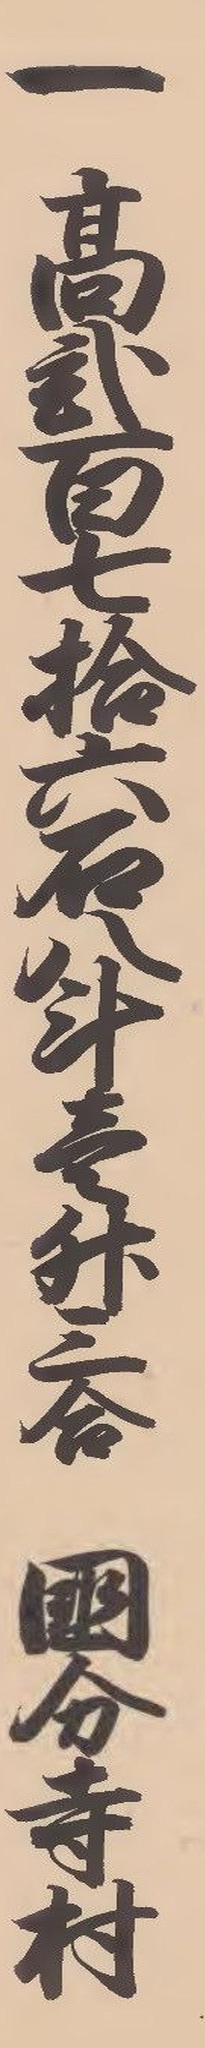一高弐百七拾六石八斗壱升三合国分寺村
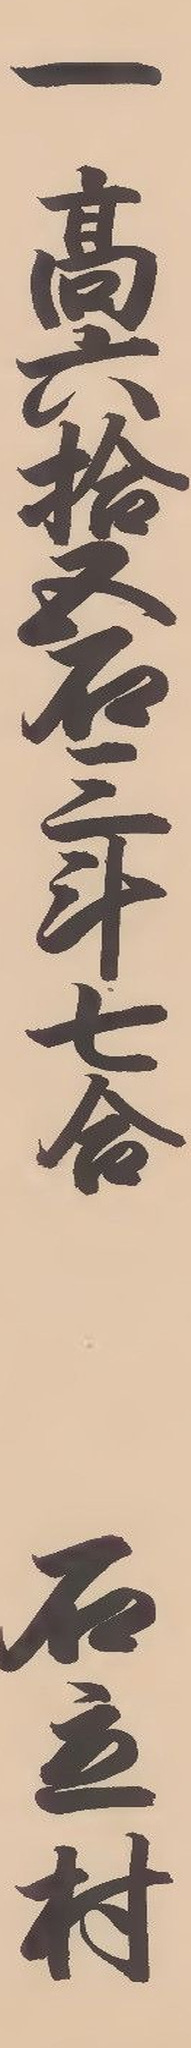一高六拾五石三斗七合石立村
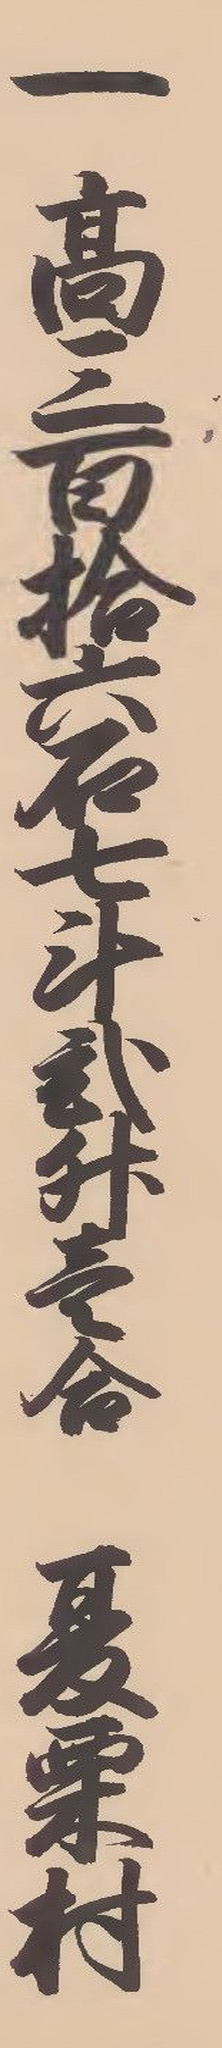一高三百拾六石七斗弐升壱合夏栗村
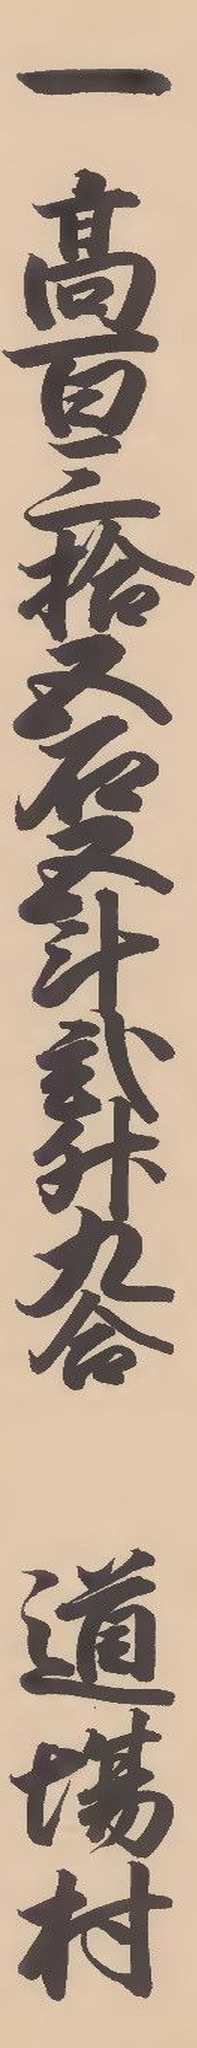一高百三拾五石五斗弐升九合道場村

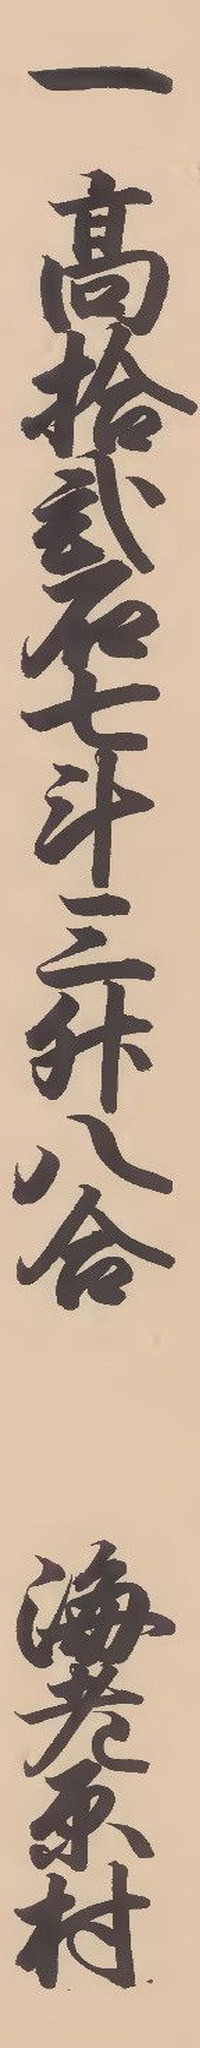一高拾弐石七斗三升八合海老原村
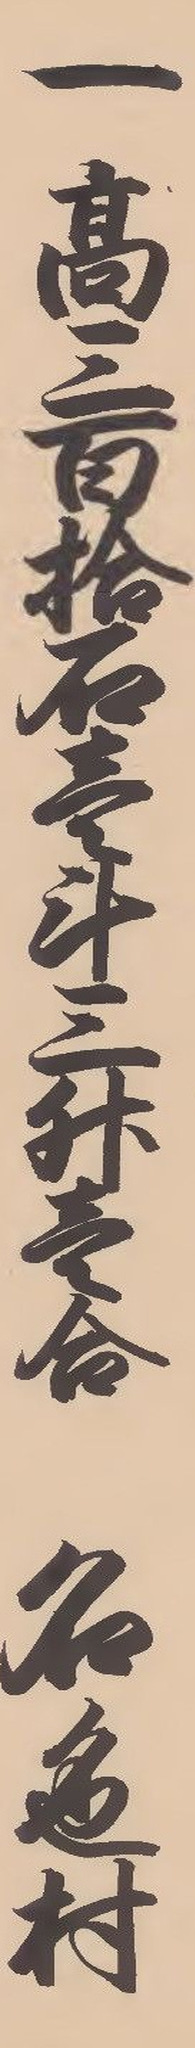一高三百拾石壱斗三升壱合名色村
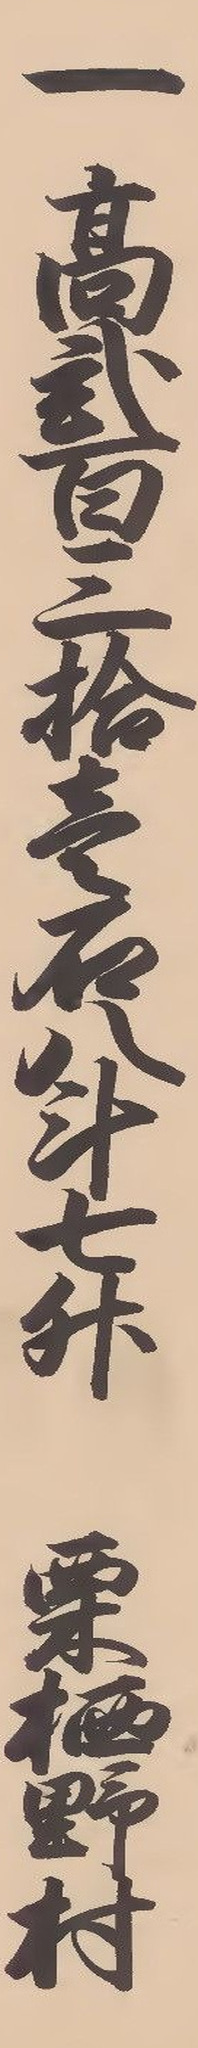一高弐百三拾壱石八斗七升栗栖野村
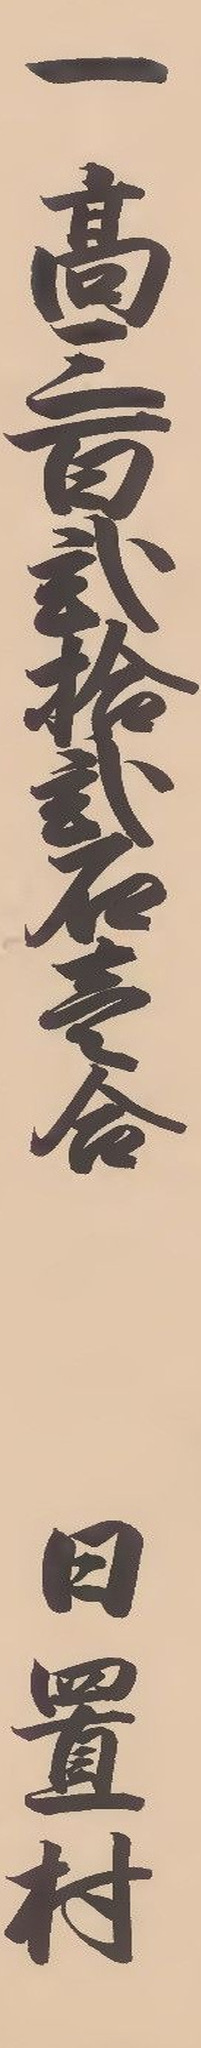一高三百弐拾弐石壱合日置村
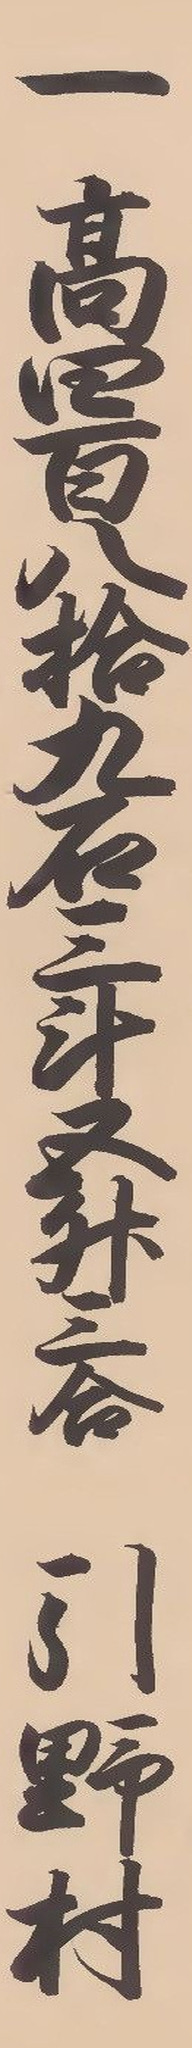一高四百八拾九石三斗五升三合引野村
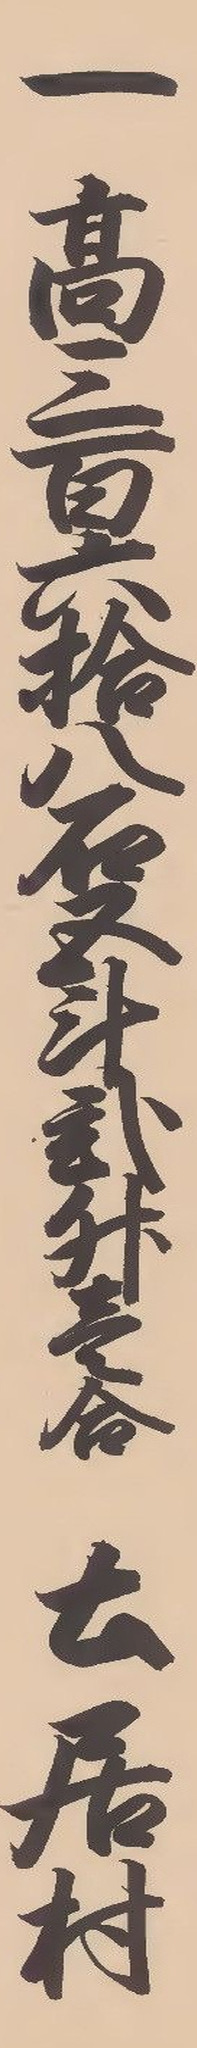一高三百六拾八石五斗弐升壱合土居村
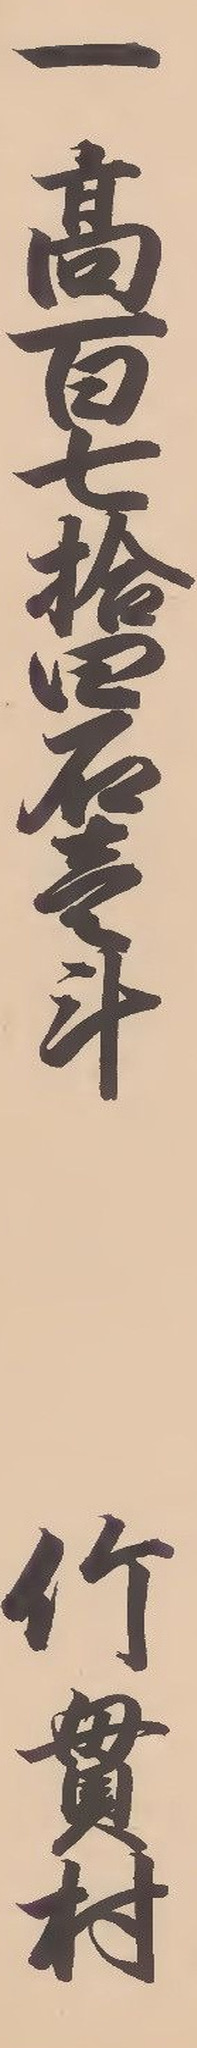一高百七拾四石壱斗竹貫村

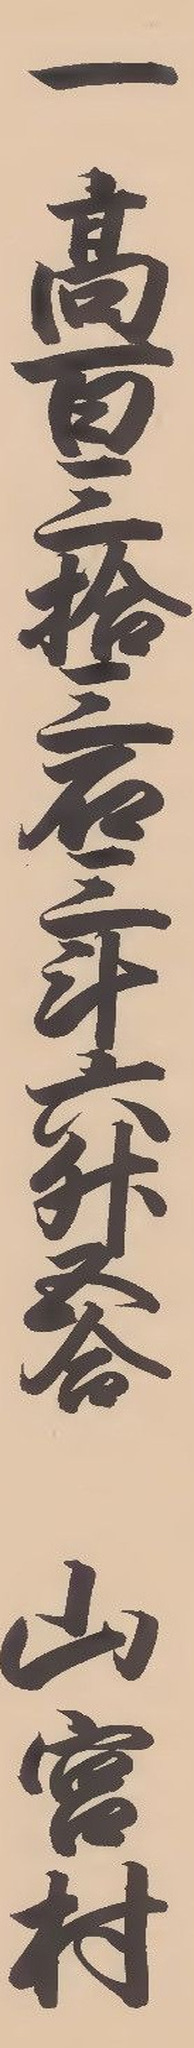一高百三拾三石三斗六升五合山宮村
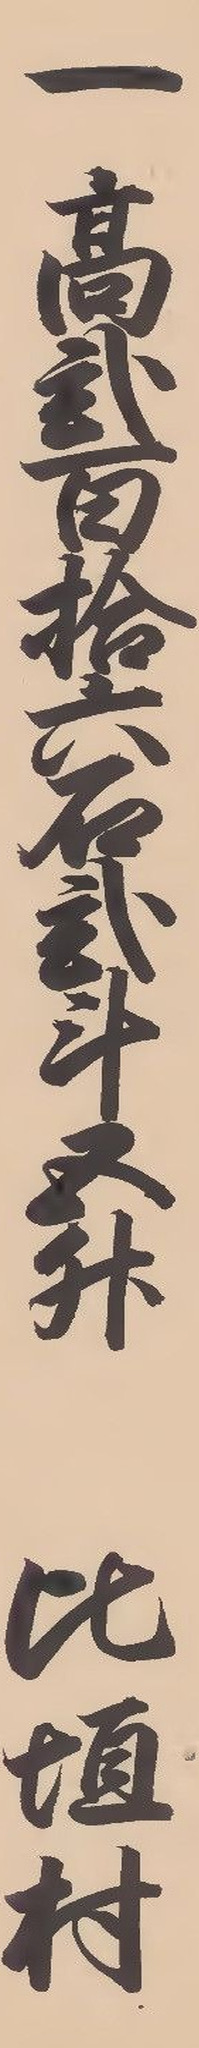一高弐百拾六石弐斗五升比垣村
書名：但馬国郷帳
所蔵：国立公文書館 National Archives of Japan
